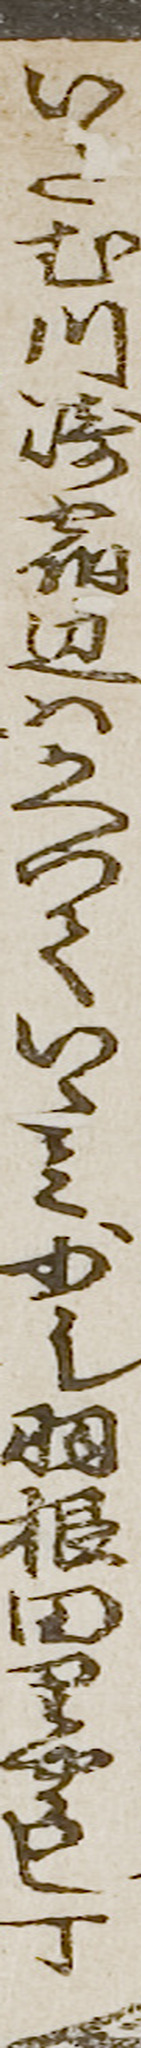いたむ川崎宿辺はかへつていたみ少シ羽根田りやうし丁
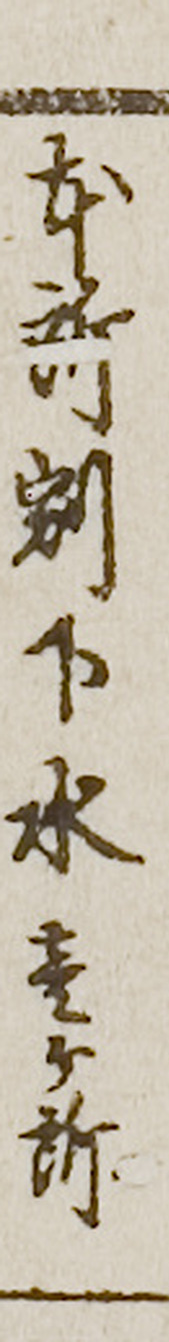本所割下水壱ケ所
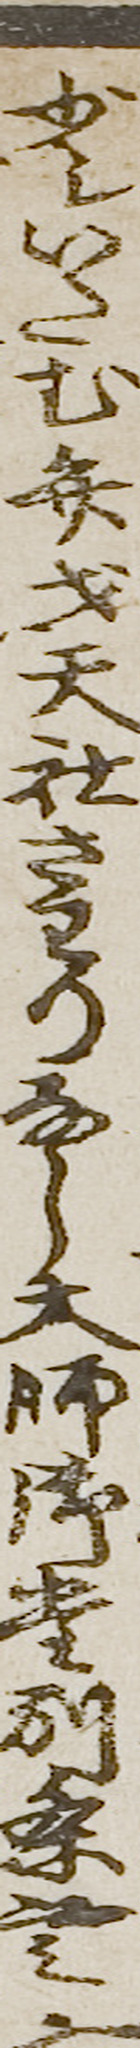少シいたむ弁才天社さわりなし大師御堂別条無之
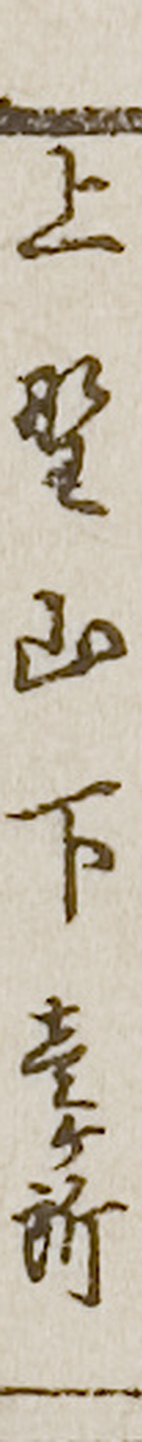上野山下壱ケ所
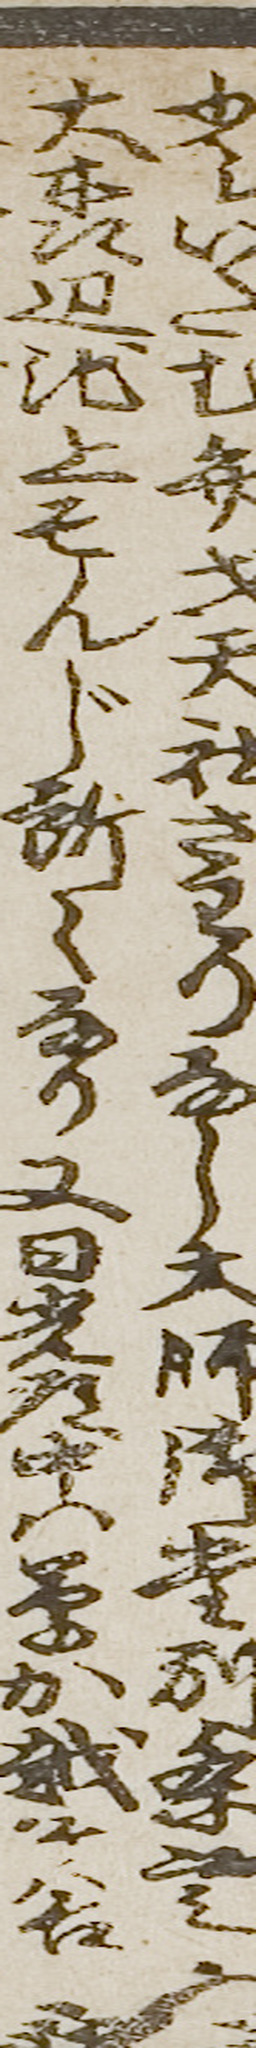大森辺池上そんじ所々なり又日光道中は草か越ケ谷
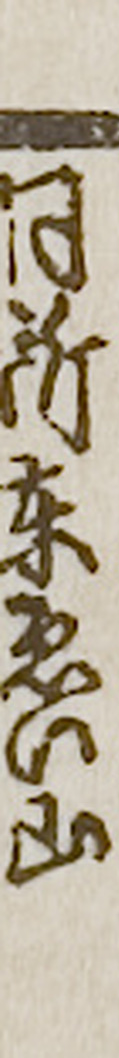同所東ゑい山
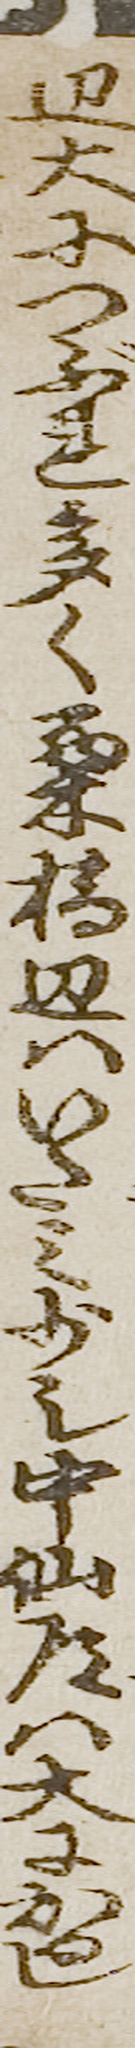辺大につぶれ多く栗橋辺はいたみ少シ中仙道は大にかるし
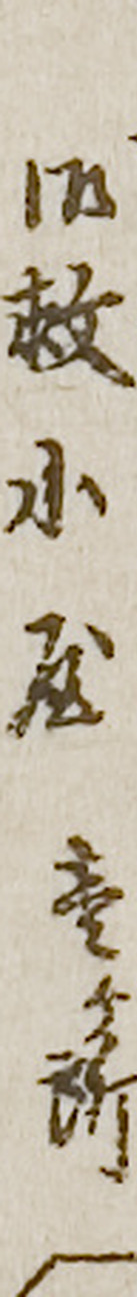御救小屋壱ケ所
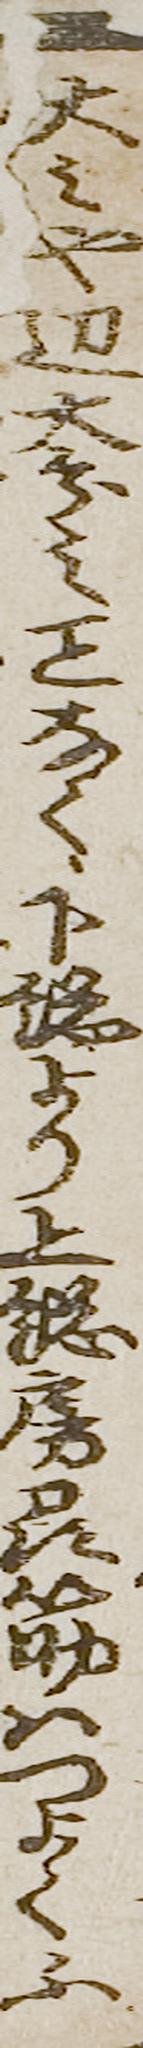大みや辺大分之ことなく下総より上総房州筋はつよくふ
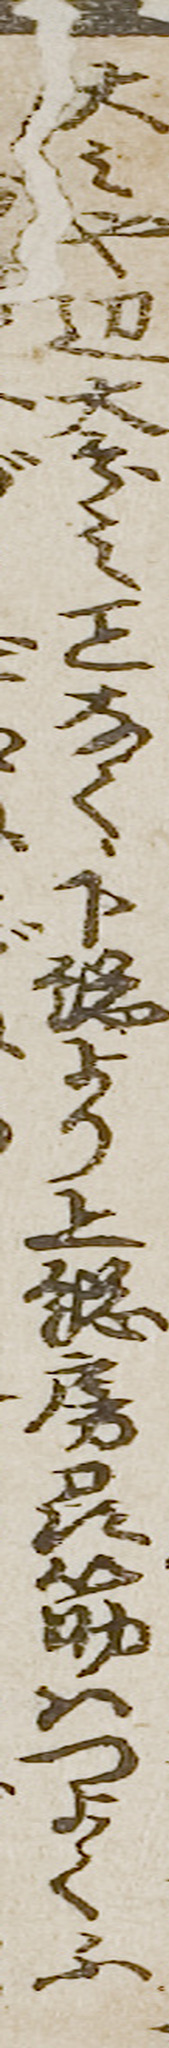大みや辺大分之ことなく下総より上総房州筋はつよくふ
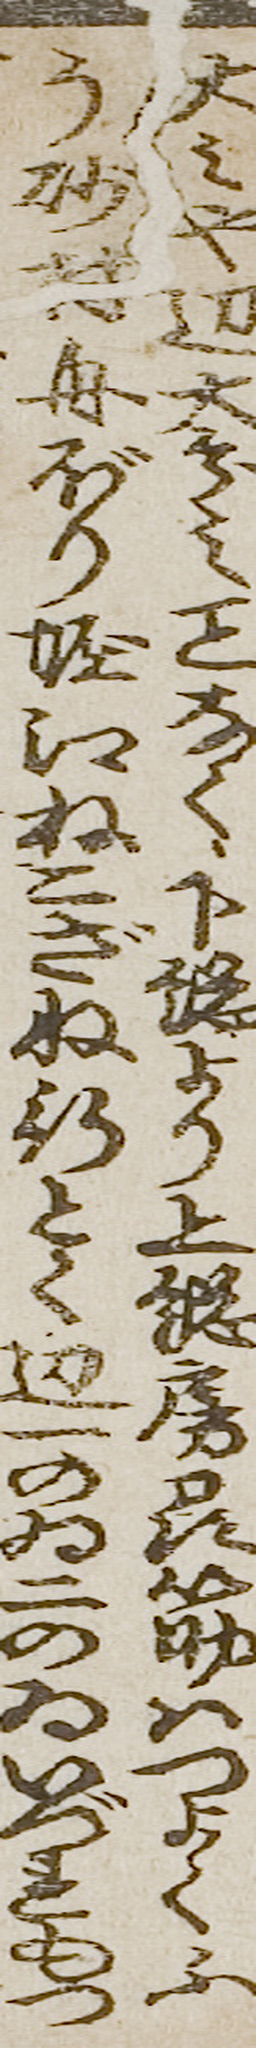う砂村舟ぼり堀江ねこざね行とく辺一のゐ二のゐいづれもつ
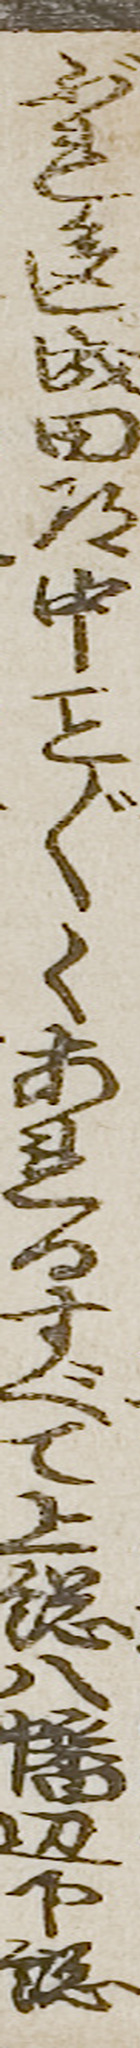ぶれ多し成田道中こと〴〵くあれるすべて上総八幡辺下総
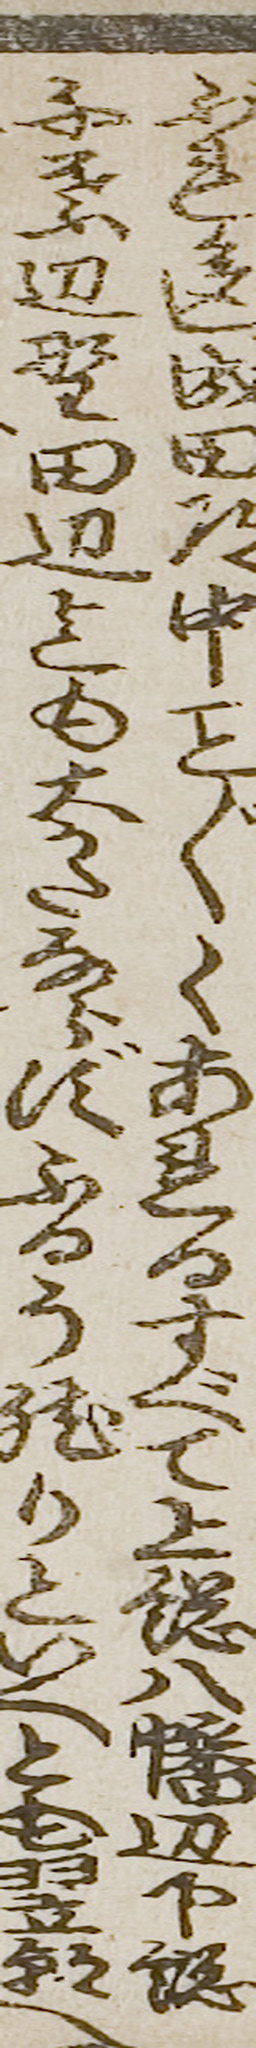千葉辺野田辺迄も大かたならずふるう然りといへとも翌朝
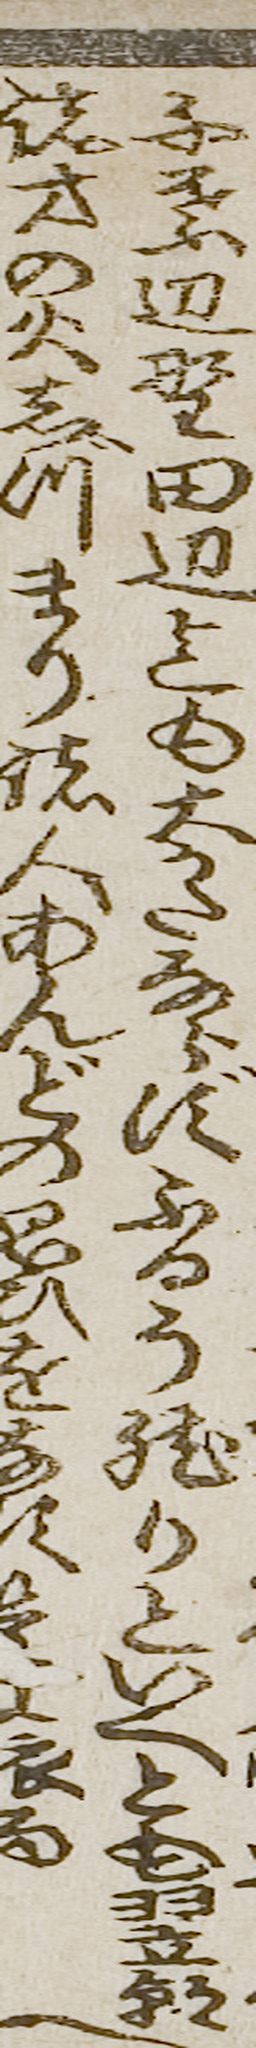諸方の火しずまり諸人あんどの思ひをなす是に依而
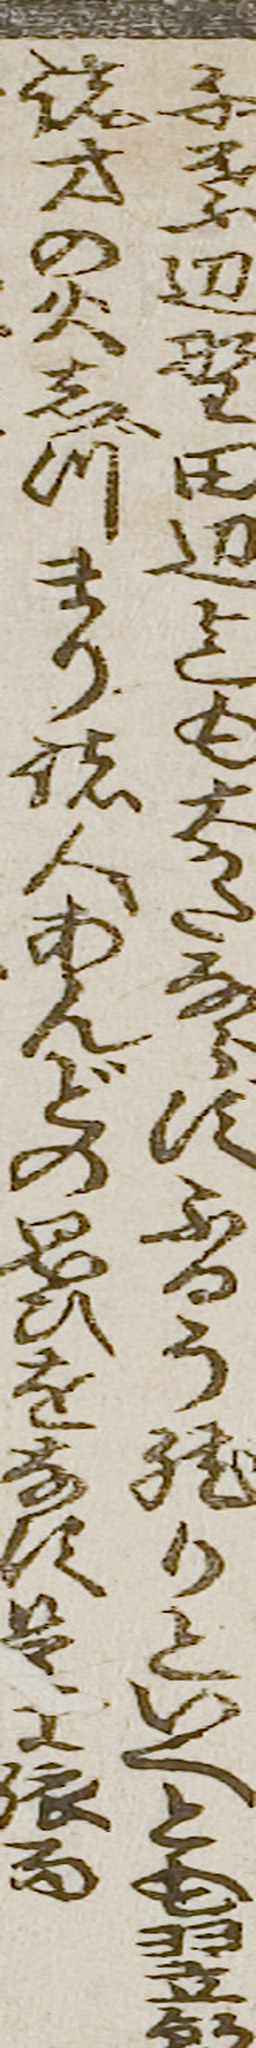諸方の火しずまり諸人あんどの思ひをなす是に依而
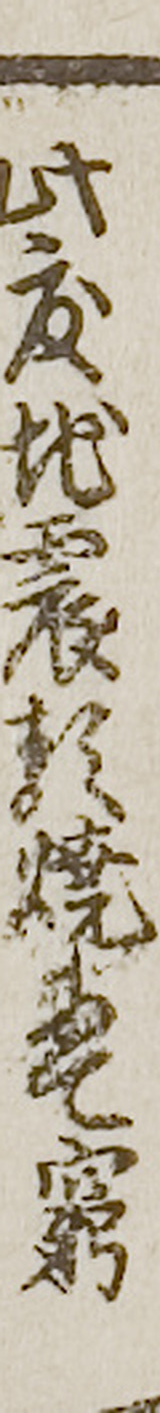此度地震類焼にて窮
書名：安政改正泰平盤石図会
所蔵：東京大学総合図書館 General Library in the University of Tokyo, JAPAN
